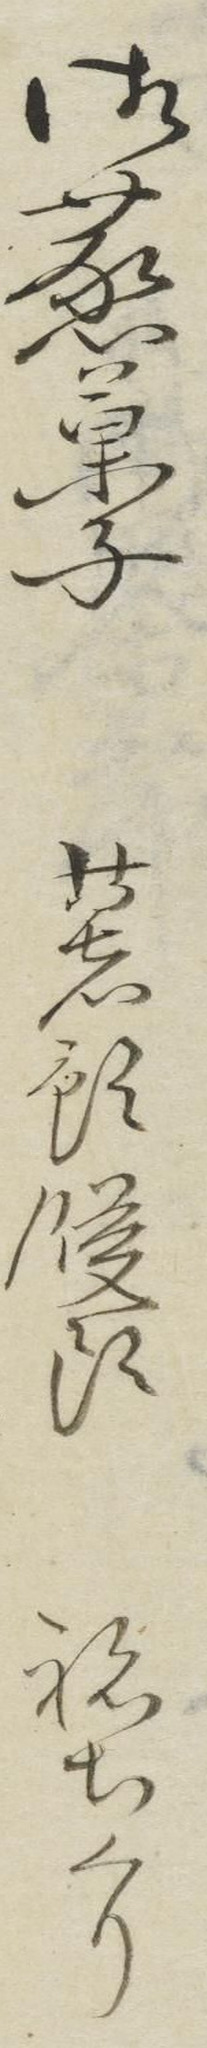御蒸菓子薯蕷饅頭祝ちくり
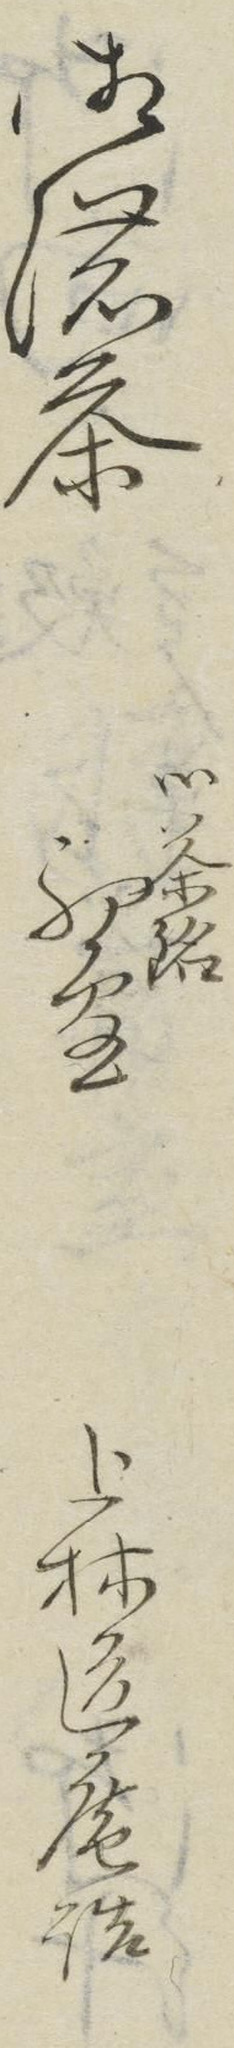御濃茶初雪上林庵詰
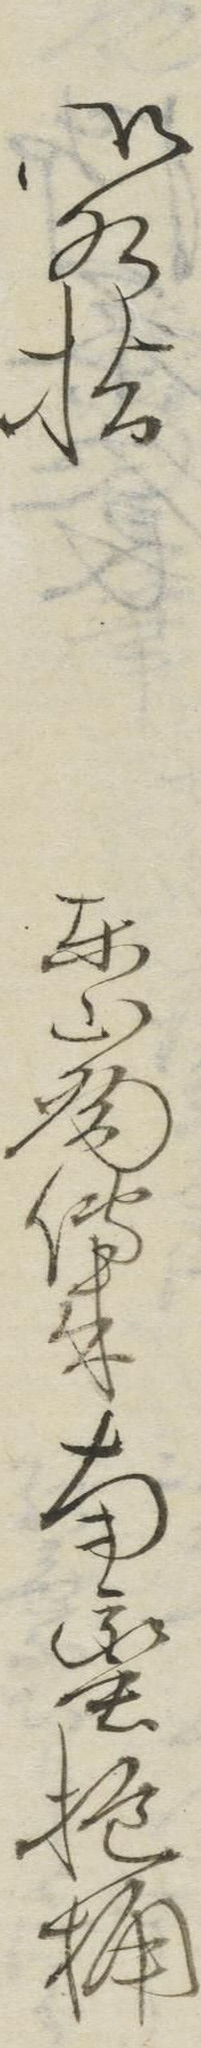御水指東山殿伝来南蛮抱桶
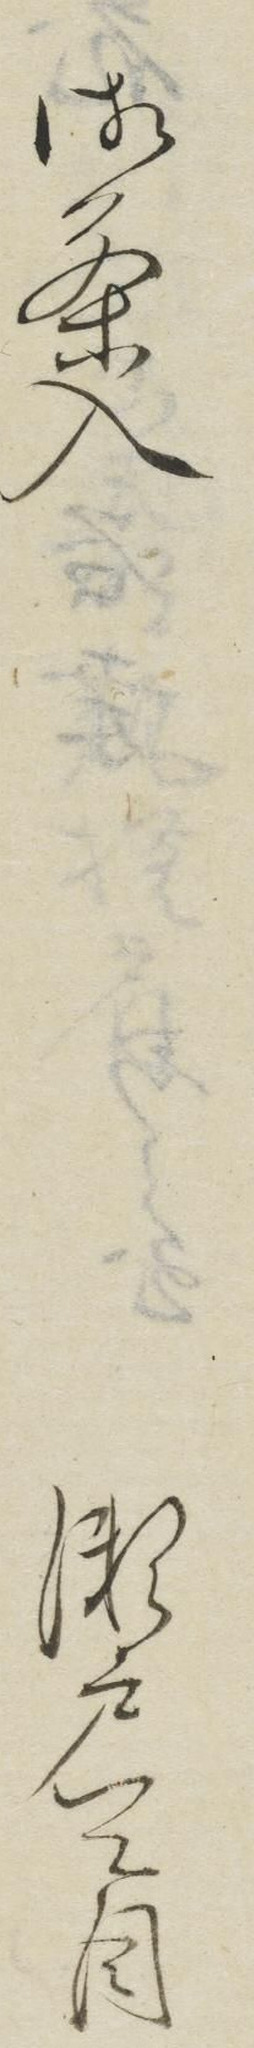御茶入瀬戸肩
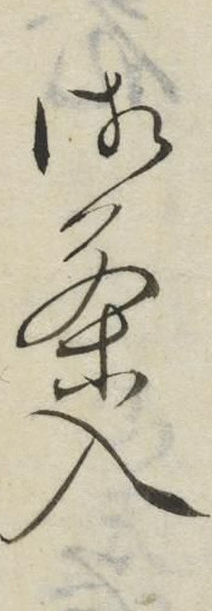御茶銘
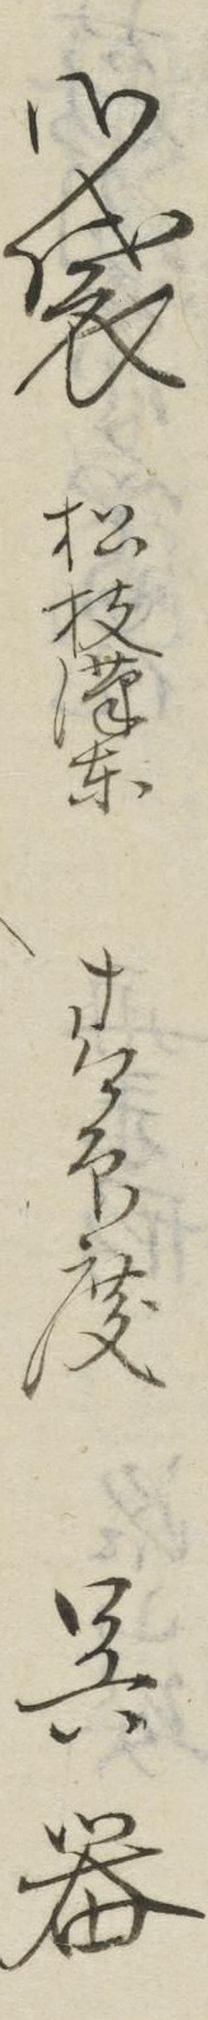御袋松枝満東青印度呉器
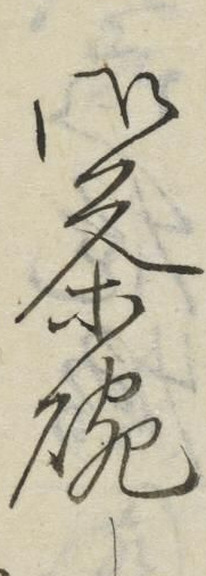御茶銘
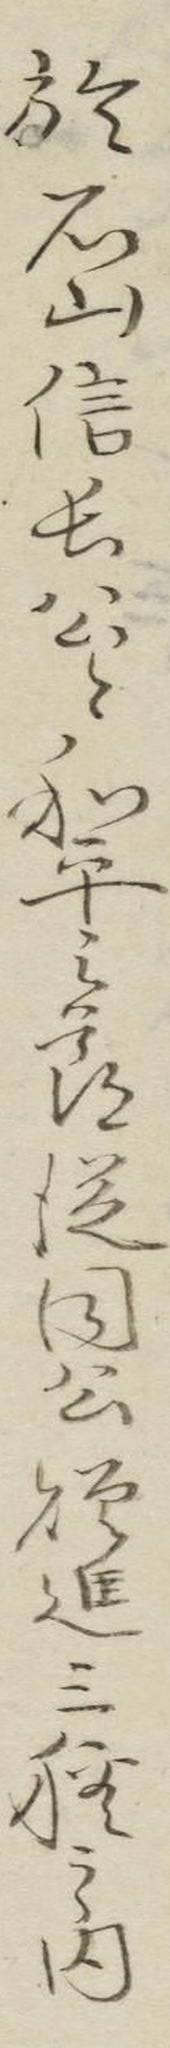御茶碗於石山信長公と和平之節従同公贈進三種之内

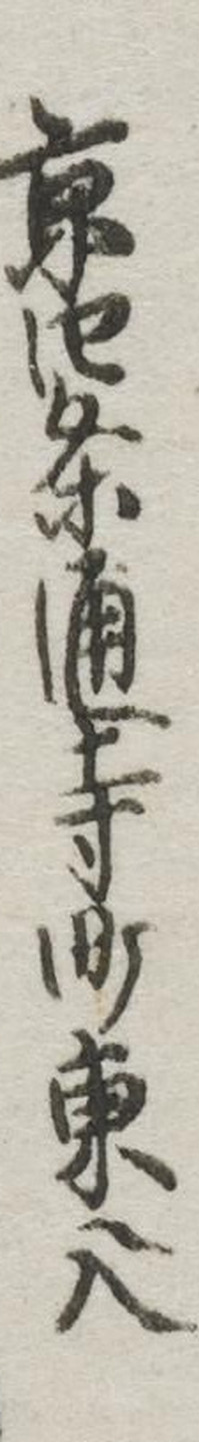京四条通寺町東へ入
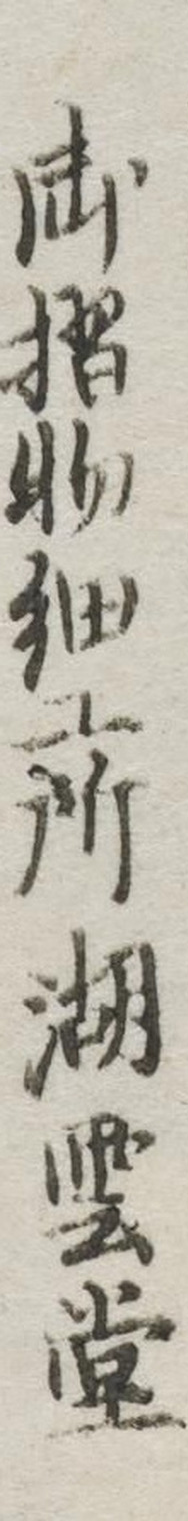御摺物細工所湖雲堂
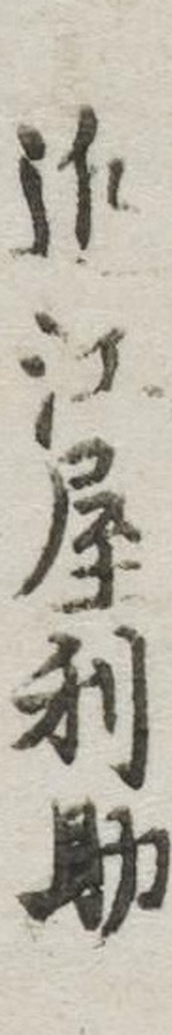近江屋利助
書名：大地震實録
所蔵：東京大学地震研究所図書室 Earthquake Research Institute Library, The University of Tokyo, JAPAN
